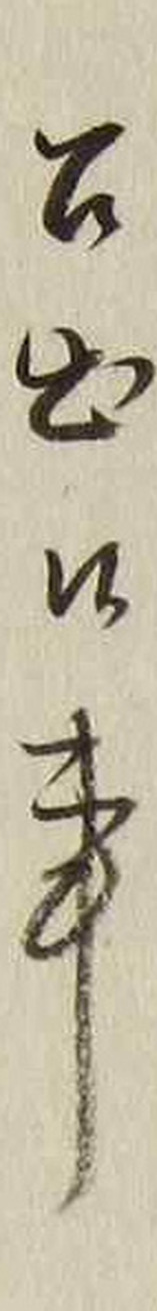召出候事

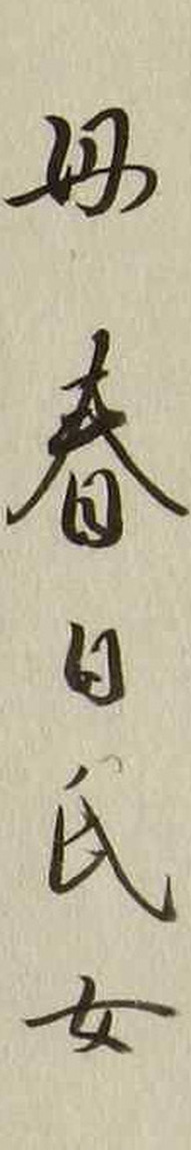母春日氏女
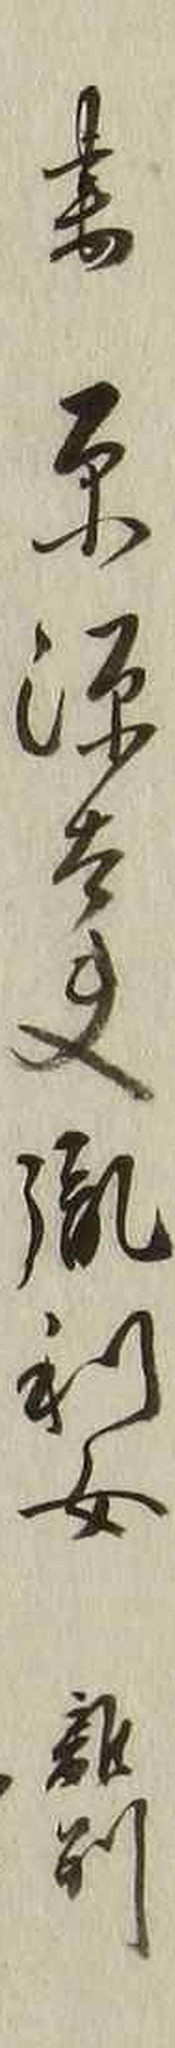妻原源太夫胤利女離別
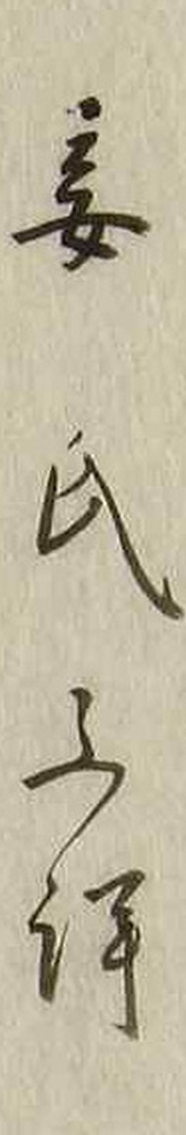妾氏不詳
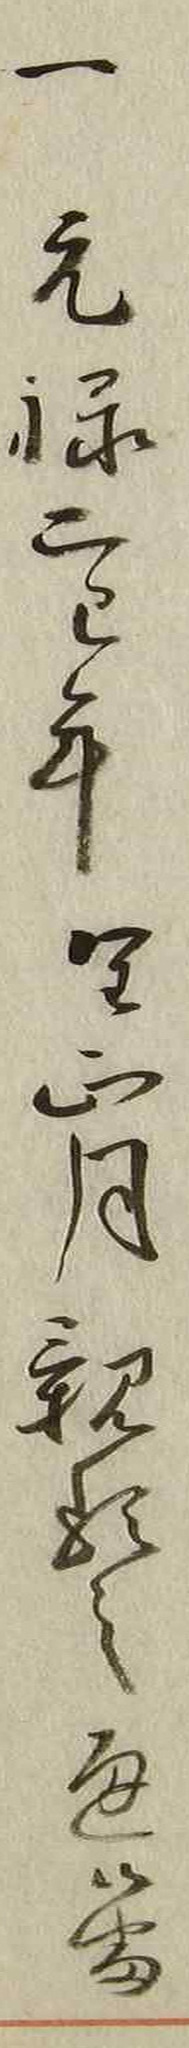一元禄二巳年閏正月親願之通御番
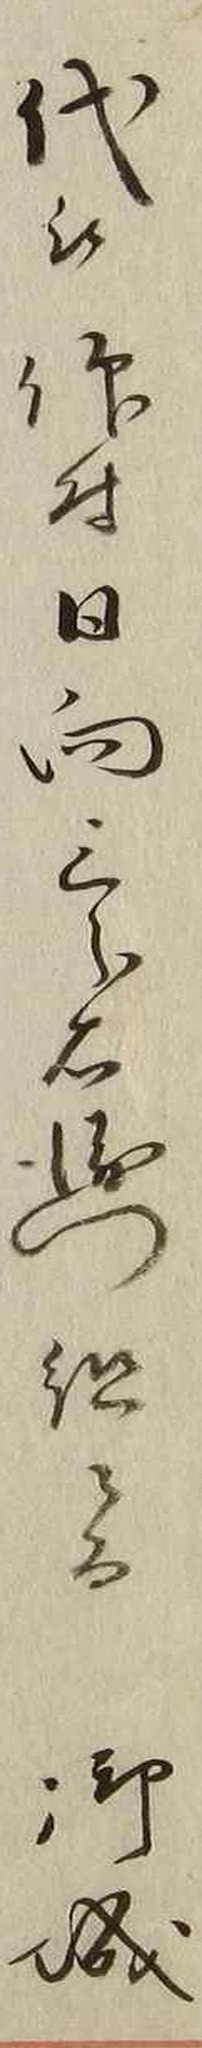代被仰付日向三郎右衛門組ニ而御城
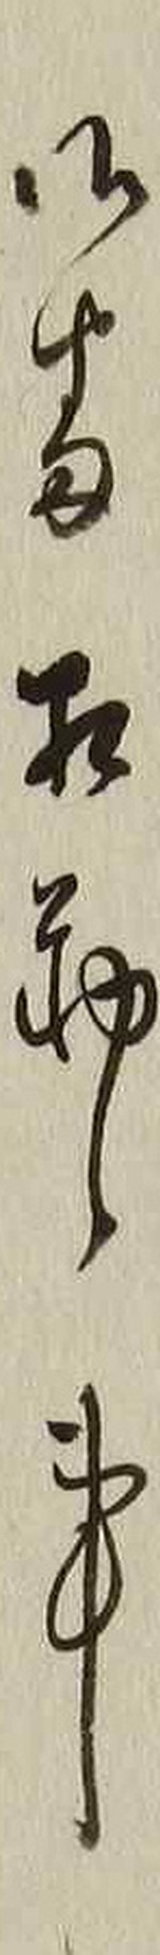御番相勤候事
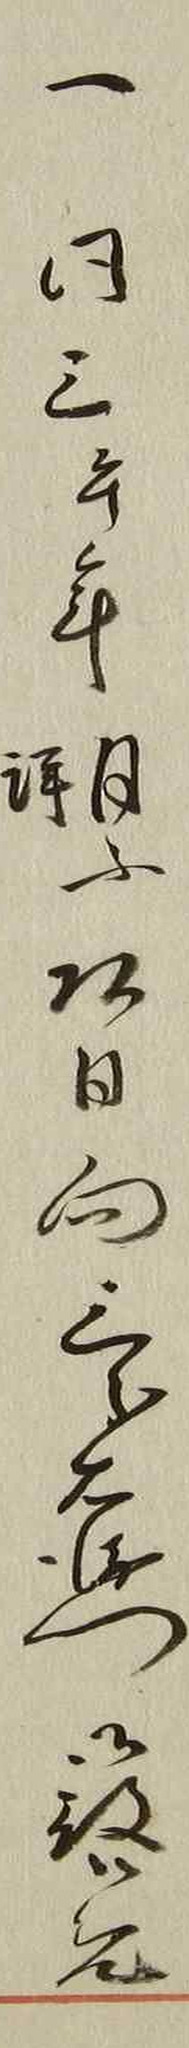一同三午年月不詳頭日向三郎右衛門御役御免
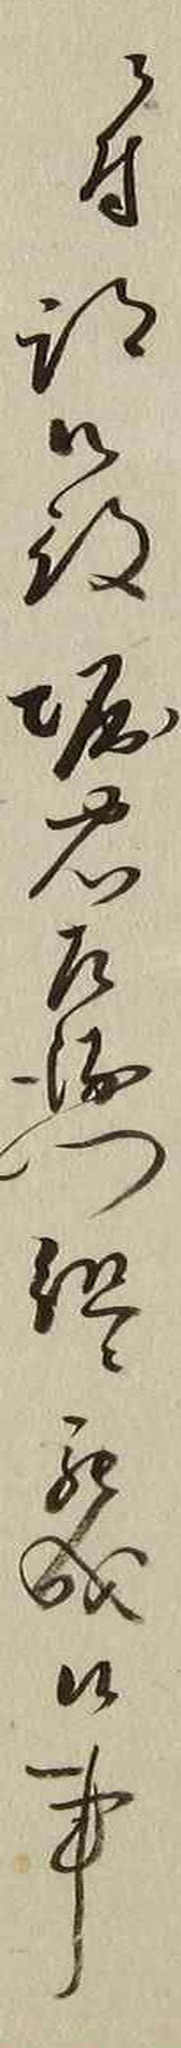ニ付跡御役堀忠左衛門組ニ罷成候事
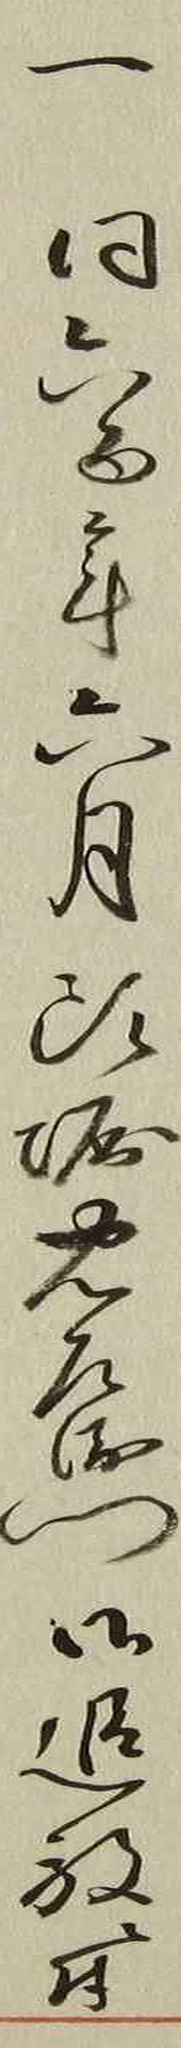一同六酉年六月頭堀忠左衛門御追放ニ付
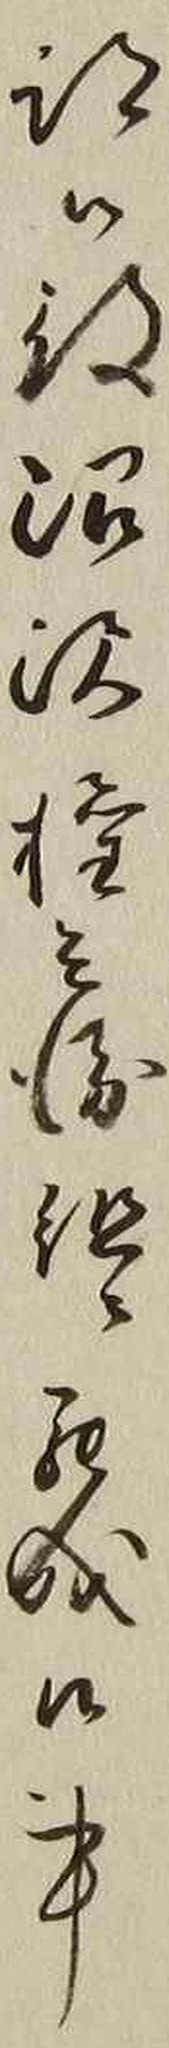跡御役沼沢権兵衛組ニ罷成候事
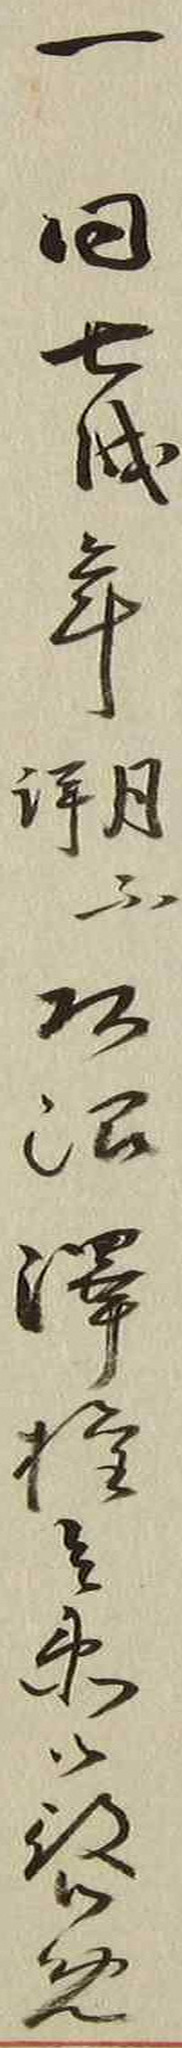一同七戌年月不詳沼沢権兵衛御役御免
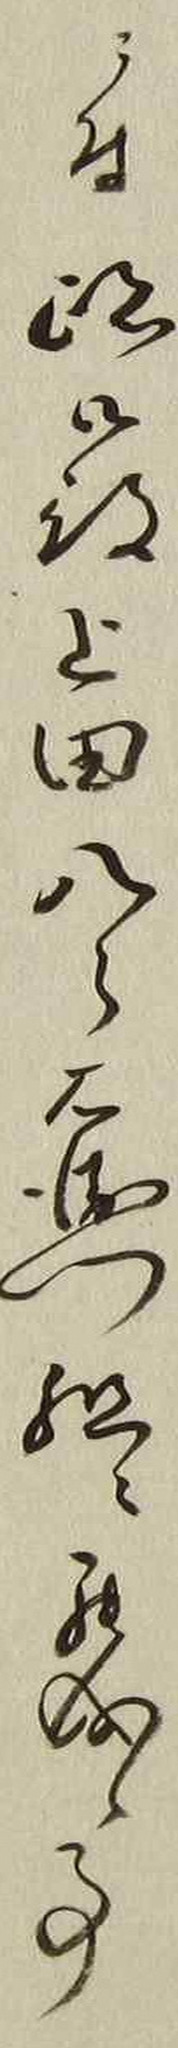ニ付跡御役上田八郎右衛門組ニ罷成候事
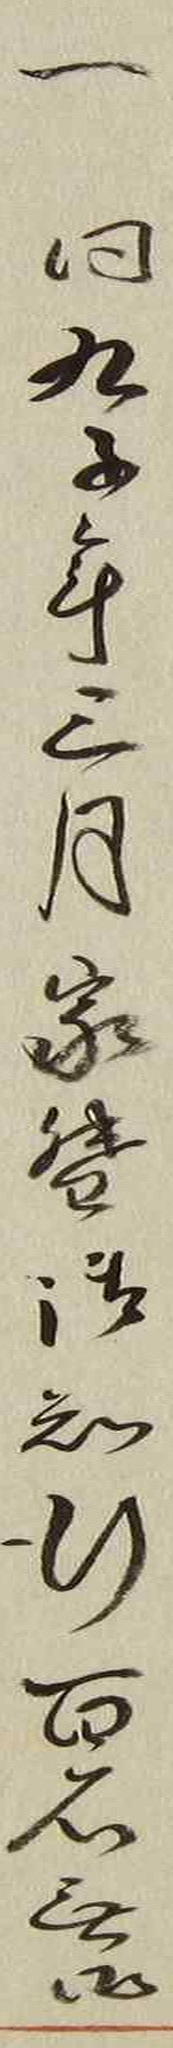一同九子年三月家督御知行百石無御
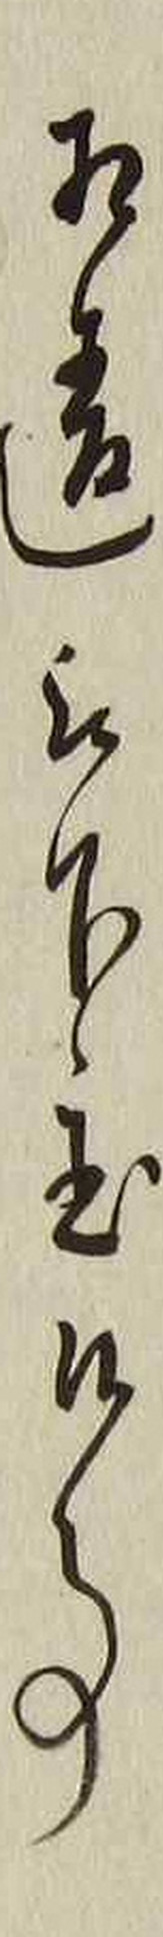相違被下置候事
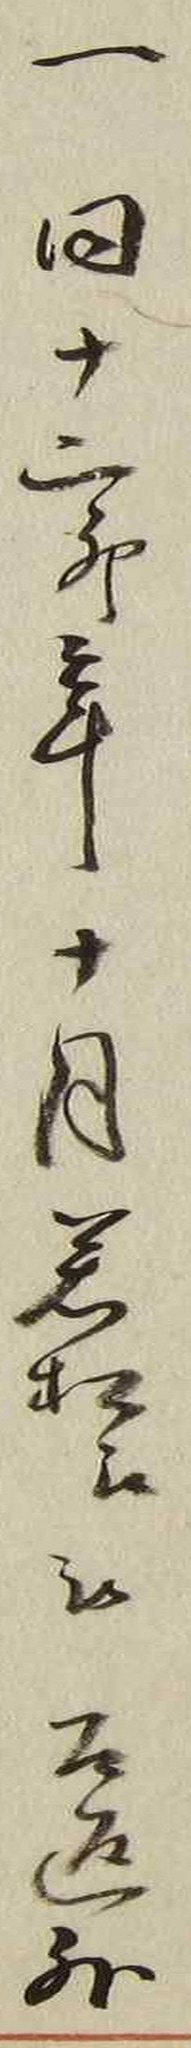一同十二卯年十月若松江被召返外
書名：諸士系譜　巻之26　い之部26
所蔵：会津若松市立会津図書館
